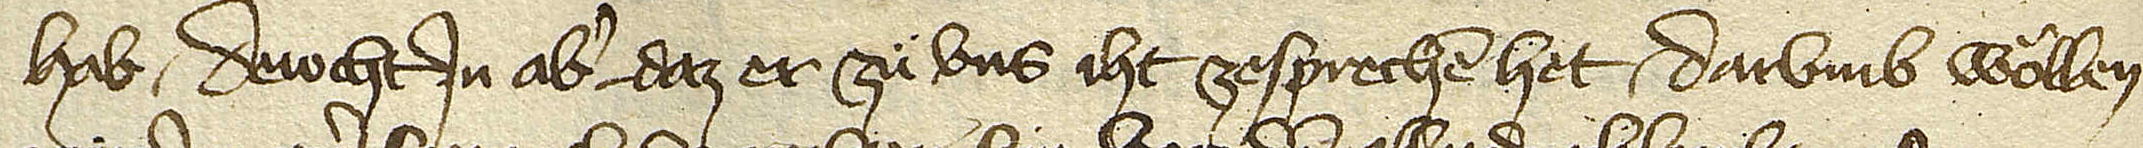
hab / Dewcht In ab* / daʒ er cʒü vns iht ceʒſpreche* het / darvmb wöllen
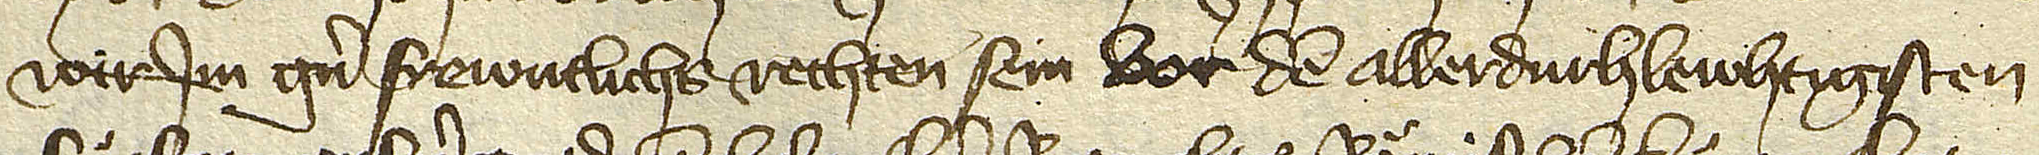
wir Im gn* frentlichs rechten ſein vor d* allerdurhlewhtigiſten
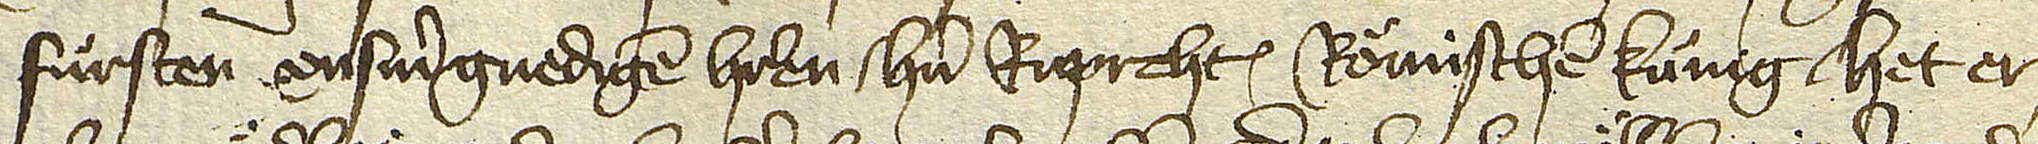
fürſten vnſm* gnedige* hr*en / hn* Rupreht* Römiſche* künig / het er
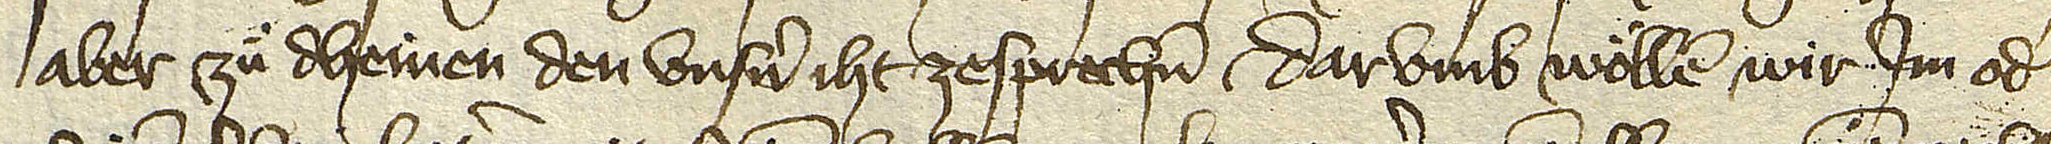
aber cʒü dheinen den vnſn* iht cʒeſprechn* / darvmb wölle* wir Im od*
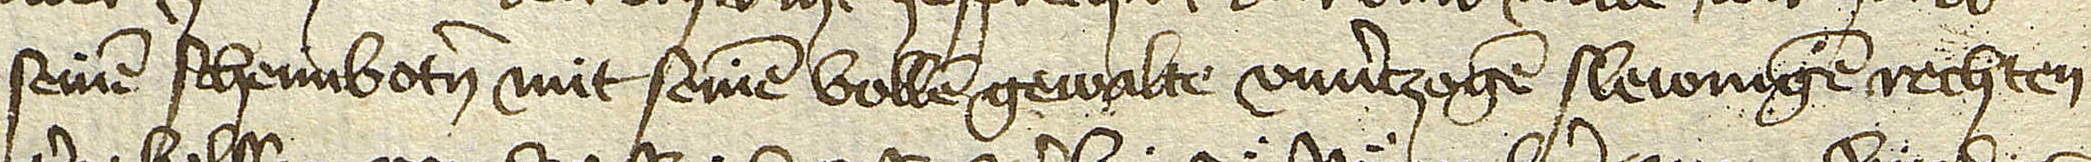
ſeine* ſcheimbotn* mit ſeine* volle* gewalte vnu*cʒoge* ſlwenige* rechten
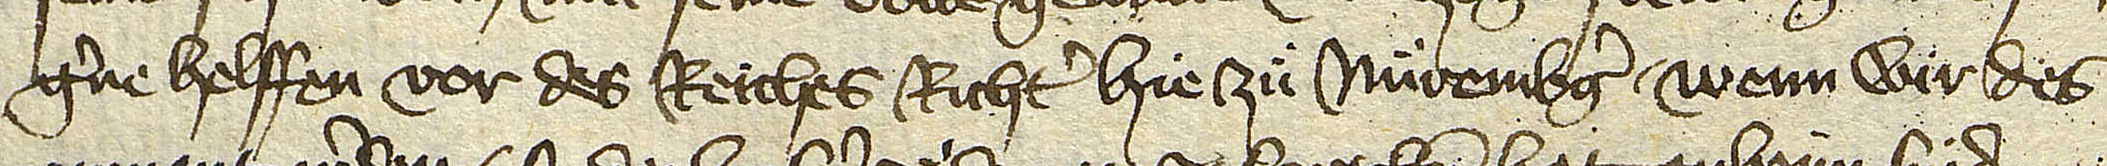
g*ne helffen vor des Reiches Richt* hie cʒü Nürembg* / wenn wir des
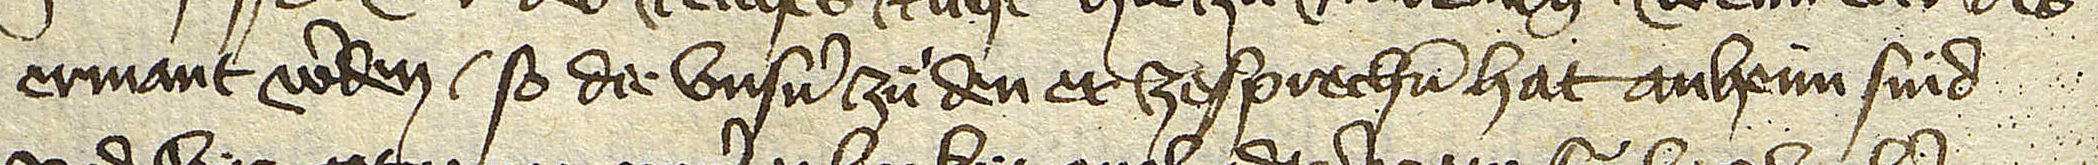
ermant w*den / ſo die vnſn* cʒü den er cʒeſprechn* hat anheim ſind
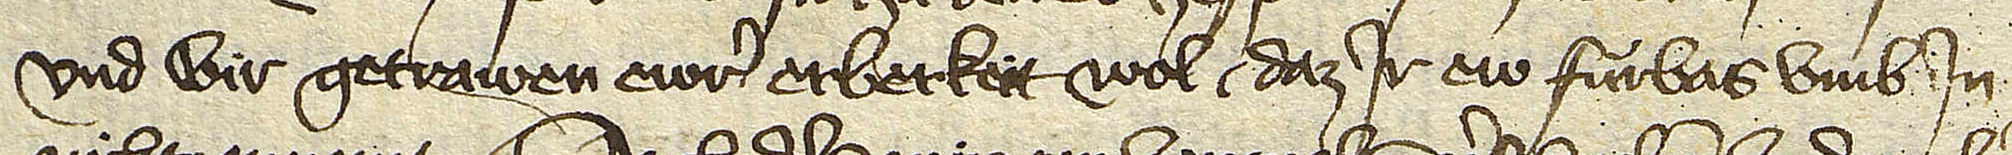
vnd wir getrawen ewr* erberkeit wol / daʒ Ir ew fürbas vmb In
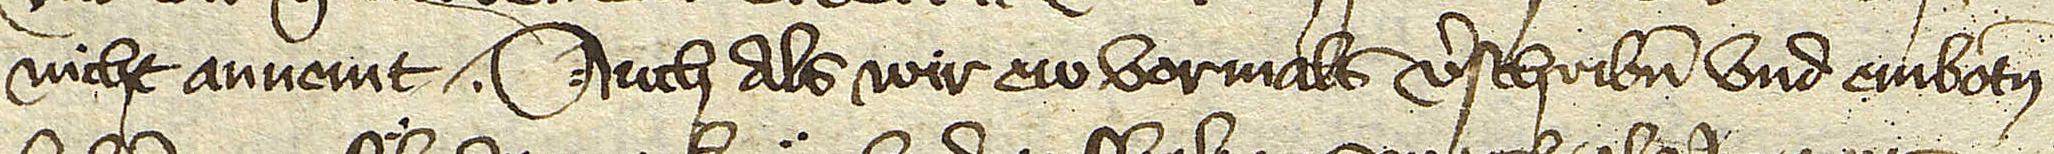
nicht annemt / . Auch Als wir ew vormals v*ſchribn* vnd embotn*
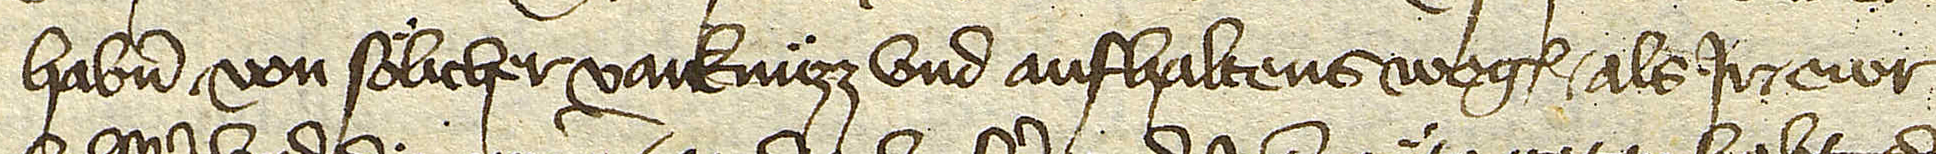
habn* von ſölicher vanknüʒʒ vnd aufhaltens wege* / als Ir / ewr
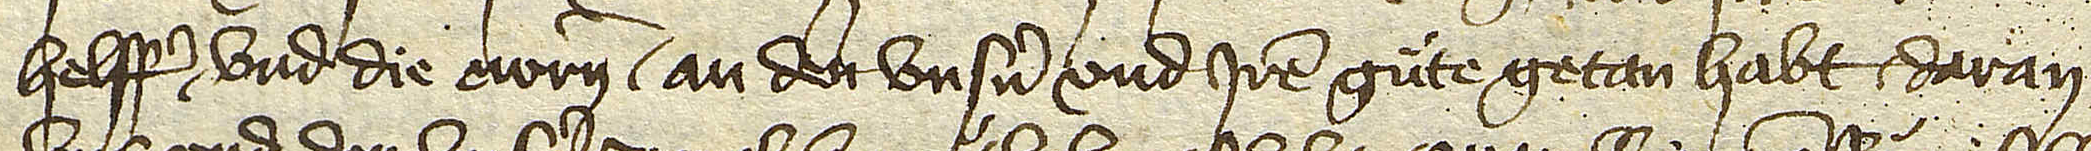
helff* / vnd die ewrn* / an den vnſn* vnd Ire* güte getan habt / daran
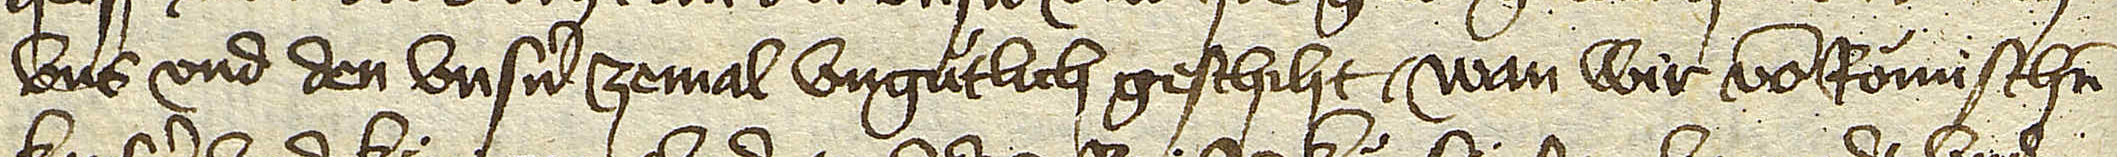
vns vnd den vnſn* cʒemal vngütlich geſchiht / wan wir vo* Römiſchn*
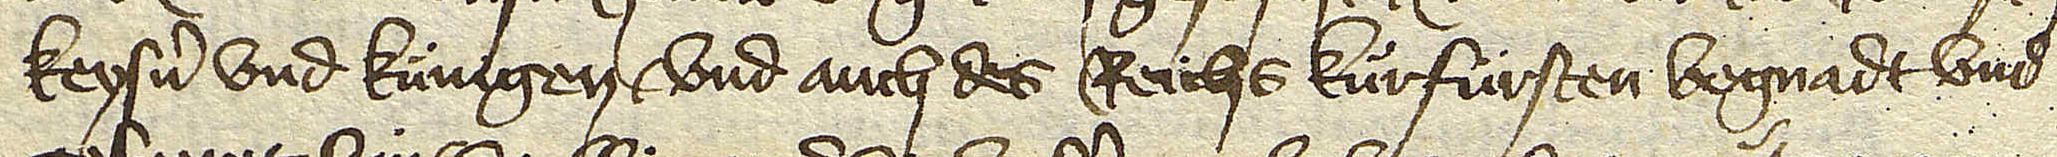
keyſn* vnd künigen / vnd auch des Reichs kürfürſten begnadt vnd
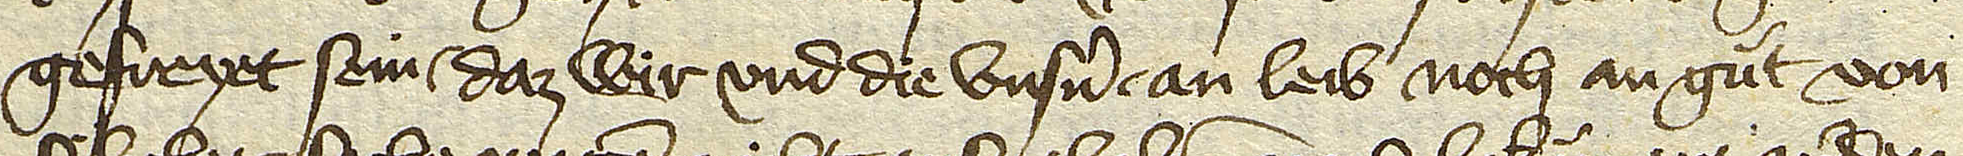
gefreyet ſein / daʒ wir vnd die vnſn* / an leib noch an güt von
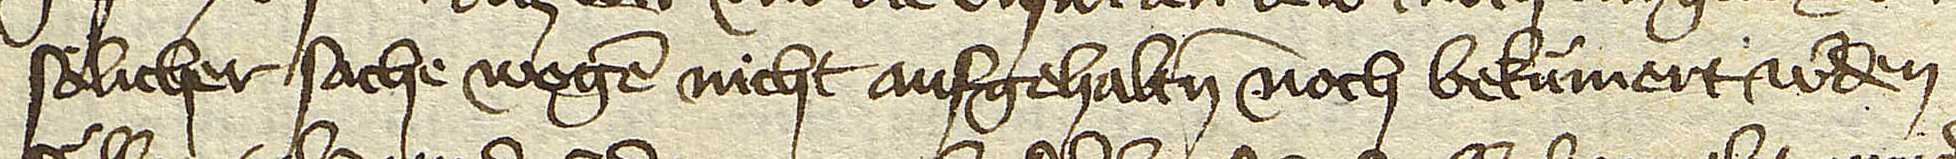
ſölicher ſache wege* nicht aufgehaltn* noch bekümert w*den
